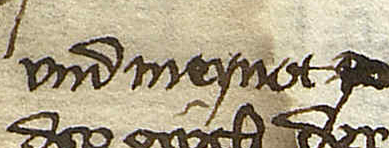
vnd meynot ʒu
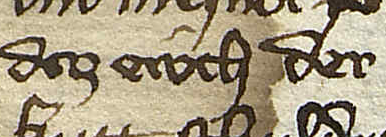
daʒ ewch der
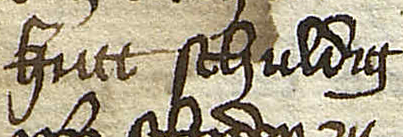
hutt ſchuldig
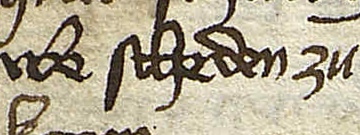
we* ſcheden ʒu
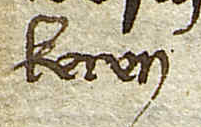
keren
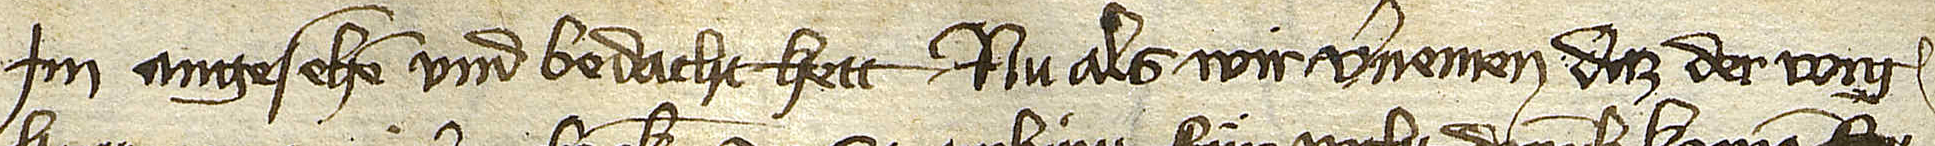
Im angeſehe* vnd bedacht hett / Nu als wir v*nemen daʒ der vorg*
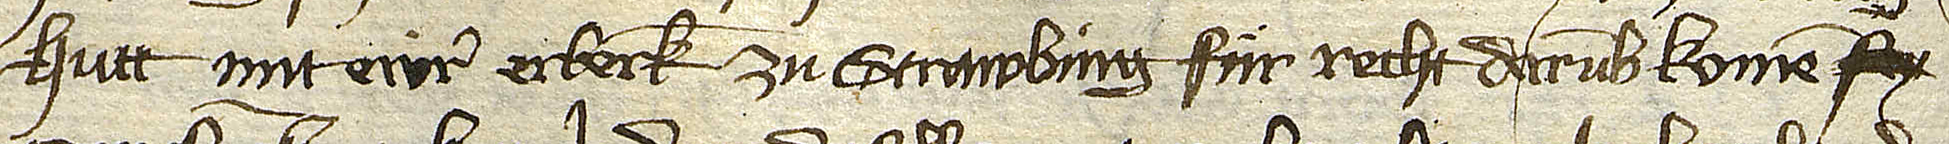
hutt mit ewr erberk* ʒu Strawbing für recht daru*b kome* ſey
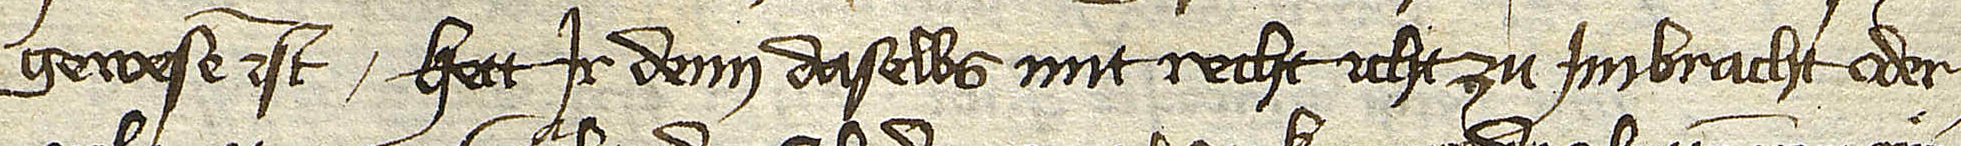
geweſe* iſt / hett Ir denn daſelbs mit recht icht ʒu Im bracht oder
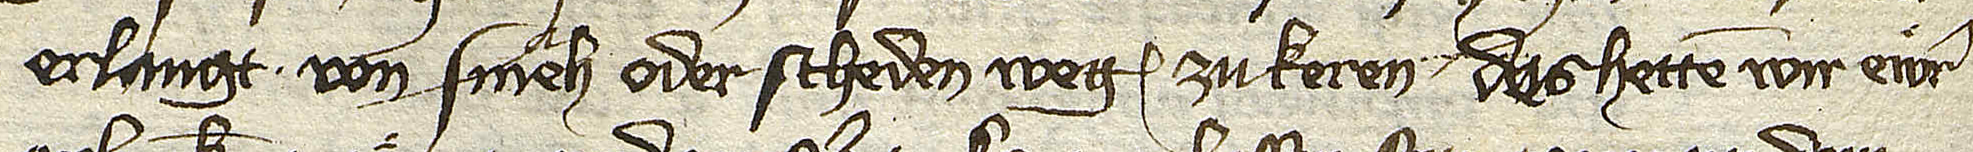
erlangt . von ſmëh oder ſcheden weg* ʒu keren / das hette* wir ew*r
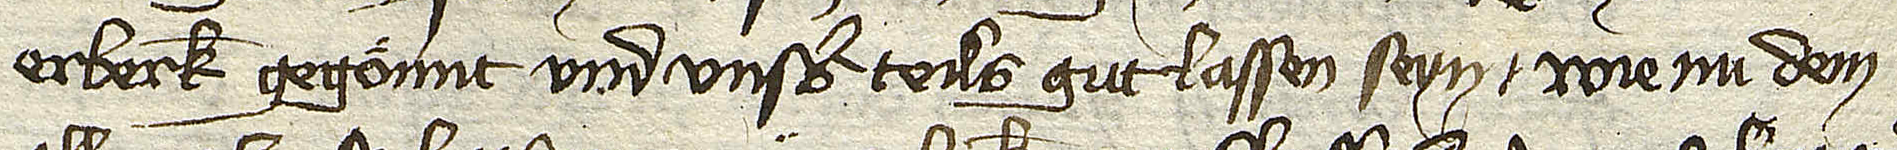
erberk* gegönnt vnd vnſ*s teils gut laſſen ſeyn / wie nu dem
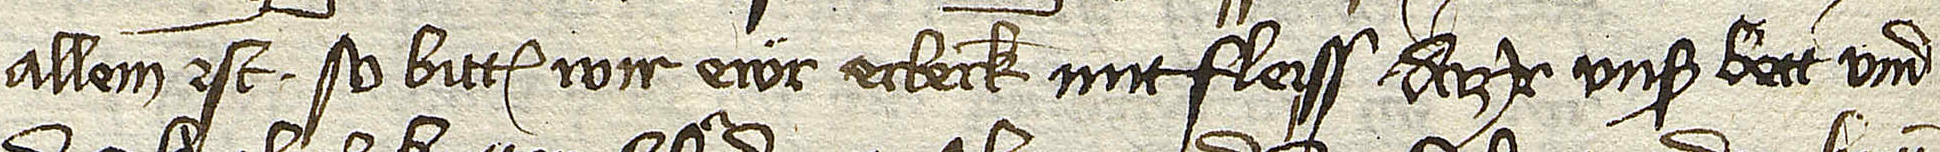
allem iſt . ſo bitt* wir ewr erberk* mit fleiſſ / daʒ Ir vnſ* bett vnd
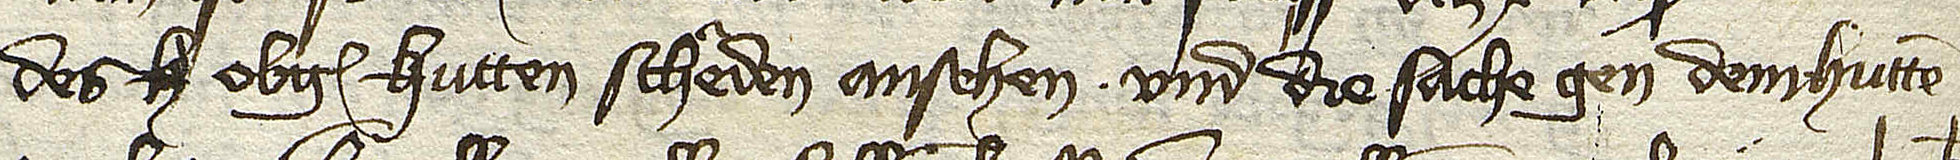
des h obg* hutten ſchëden anſehen . vnd die ſache gen dem hutte*
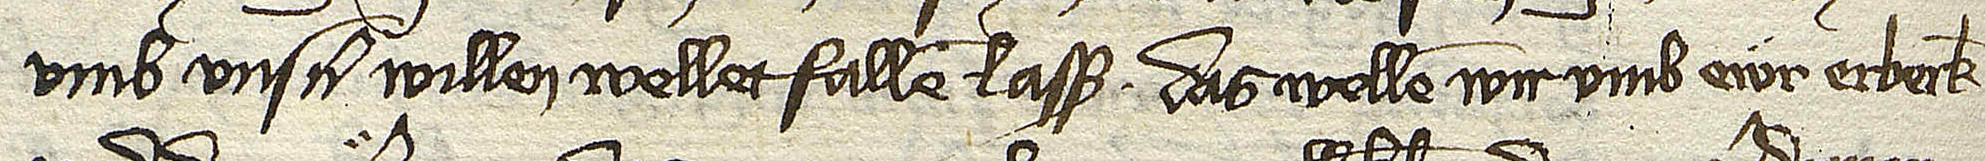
vmb vnſ*n willen wellet falle* laſſ* . Das welle* wir vmb ewr erberk*
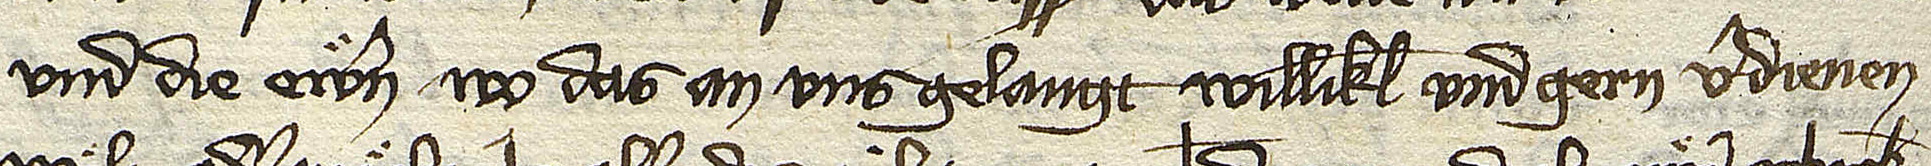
vnd die ew*n / wo das an vns gelangt willikl* vnd gern v*dienen
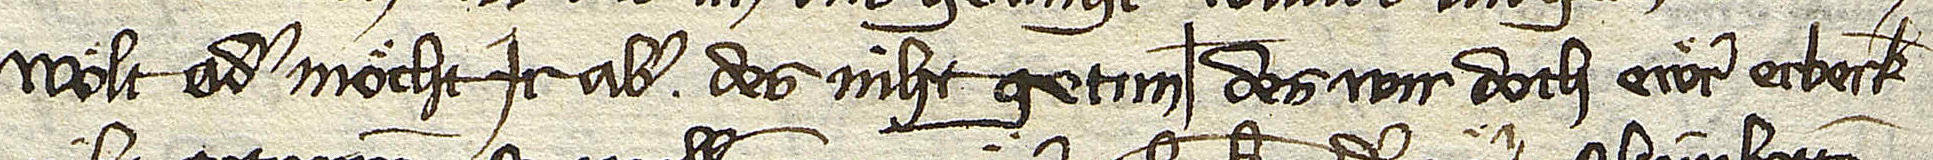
wölt od* möcht Ir ab* . des niht getun des wir doch ew*r erberk*
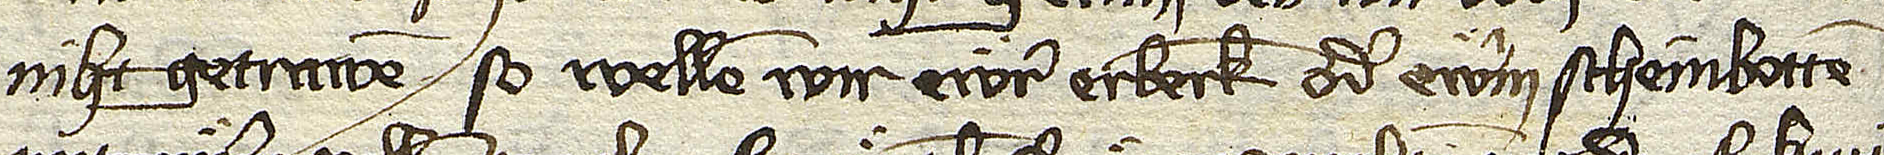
niht getrawe* . ſo welle* wir ew*r erberk* od* ew*m ſcheinbotte*
